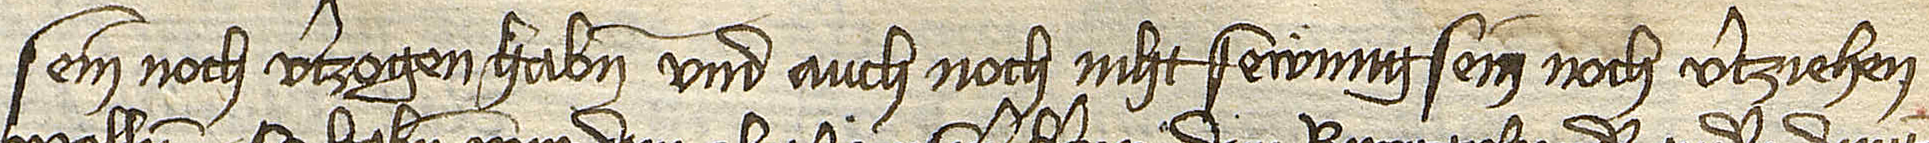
ſein noch v*cʒogen habn* vnd auch noch niht ſeẅmig ſein noch v*cʒiehen
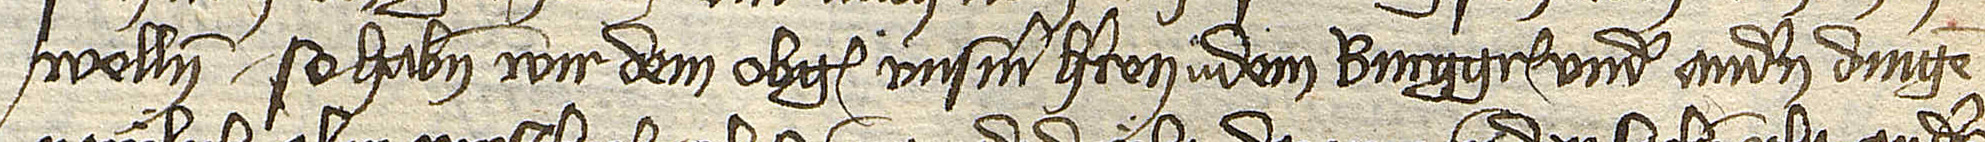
welln* / ſo habn* wir dem obg* vnſm* h*ren ~ dem Burggr* vnd* and*n dinge*
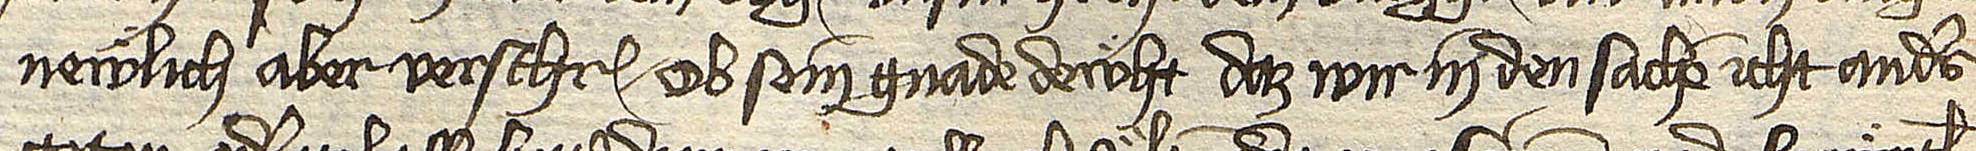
neẅlich aber verſchr* / Ob ſein gnade deẅht daʒ wir in den ſache* icht and*s
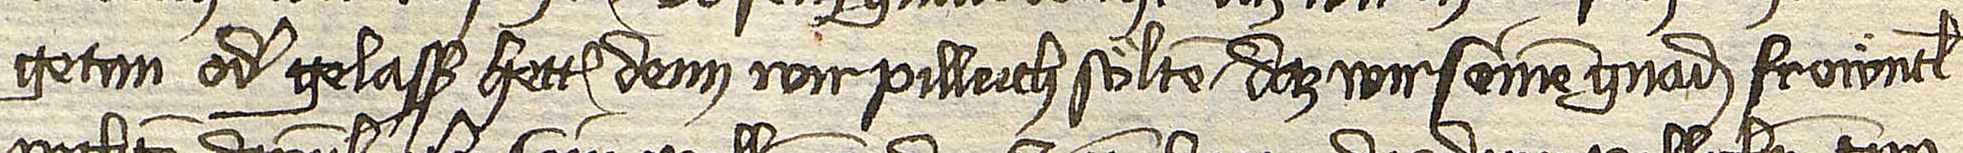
getan od* gelaſſ* hett* denn wir pilleich ſölte* / daʒ wir ſeine* gnad* freẅntl*
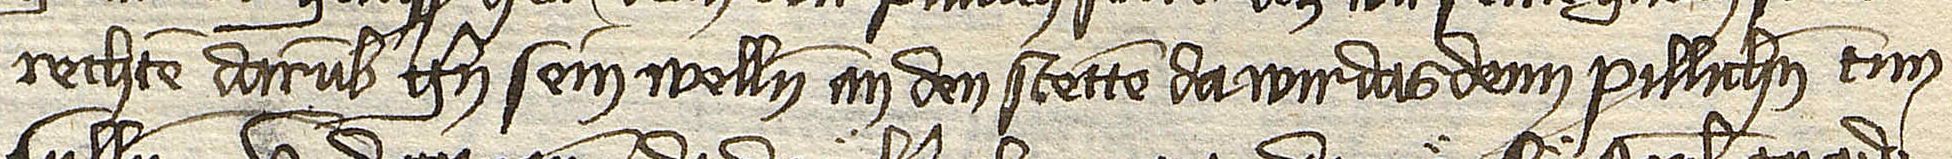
rechte* darub* g*n ſein welln* an den ſtette* da wir das denn pillichn* tun
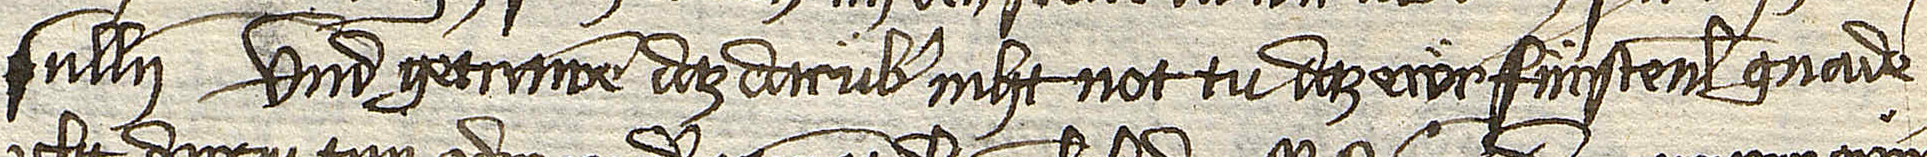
ſulln* Vnd getrawe* daʒ darüb* niht not tu daʒ eẅr fürſtenl* gnade
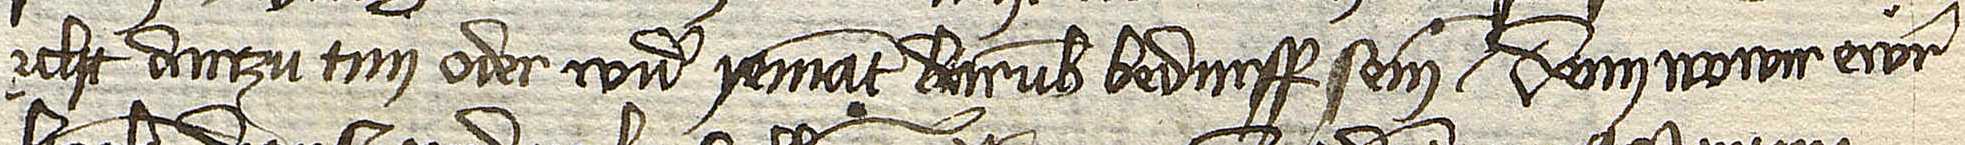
icht darcʒu tun oder wid* yema*t darub* bedurff ſein / Denn wo wir eẅr*
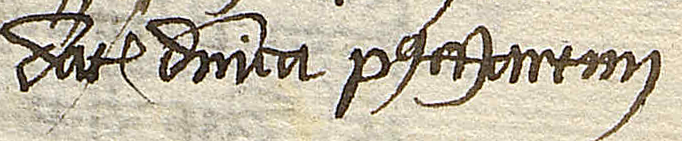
Dat* dnica* p* Martini
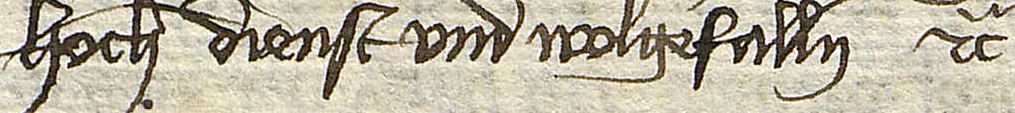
hoch* dienſt vnd wolgefalln* ec*
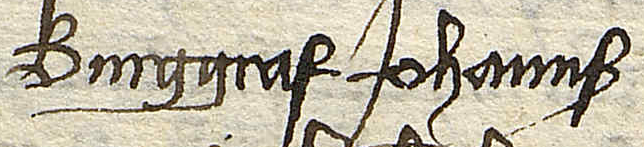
Burggraf Iohannſ*
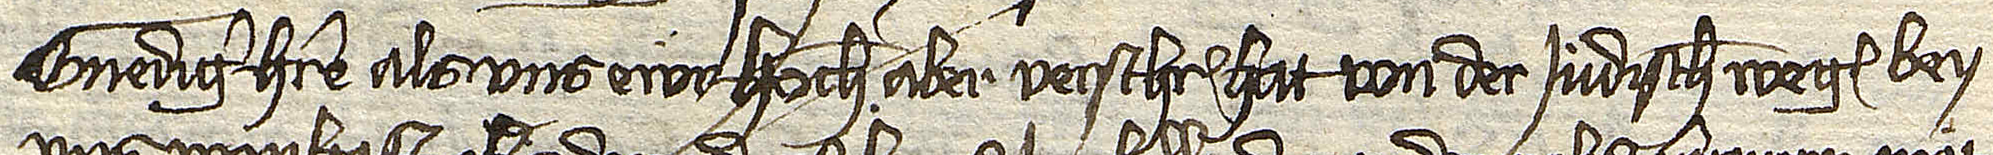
Gnedig* h*re als vnd eẅr Hoch* aber verſchr* hat von der Iüdiſch* weg* bey
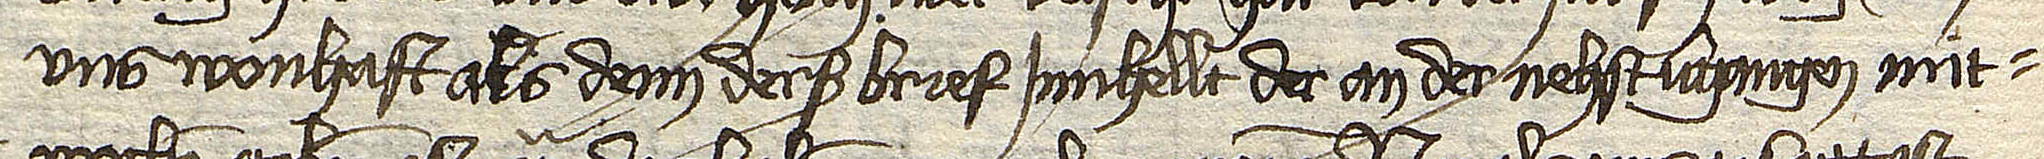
vns wonhaft als denn derſ* brief Innhellt der an der nehſtu*gangen mit =
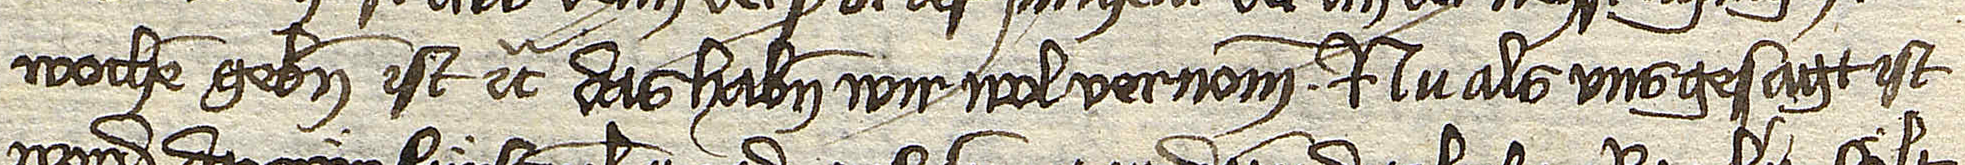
woche* gebn* iſt ec* das habn* wir wol vernom* . Nu als vns geſagt iſt
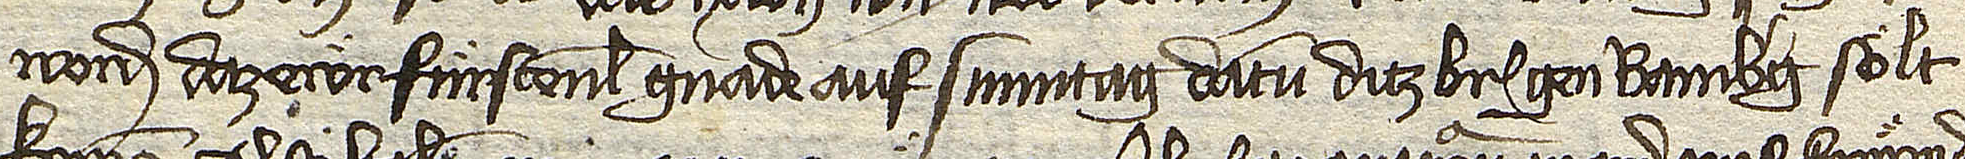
word* daʒ eẅr fürſtenl* gnade auf ſunntag datu* dicʒ br* gen Bamb*g ſölt
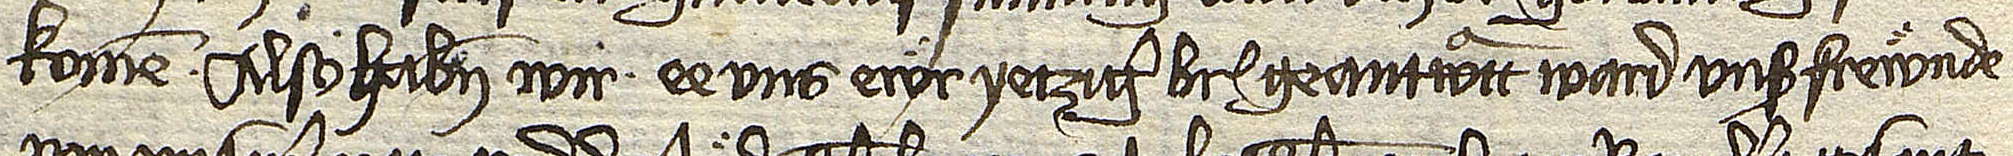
kome* . Alſo habn* wir . ee vns eẅr yecʒig* br* geantw*tt ward vnſ* freẅnde
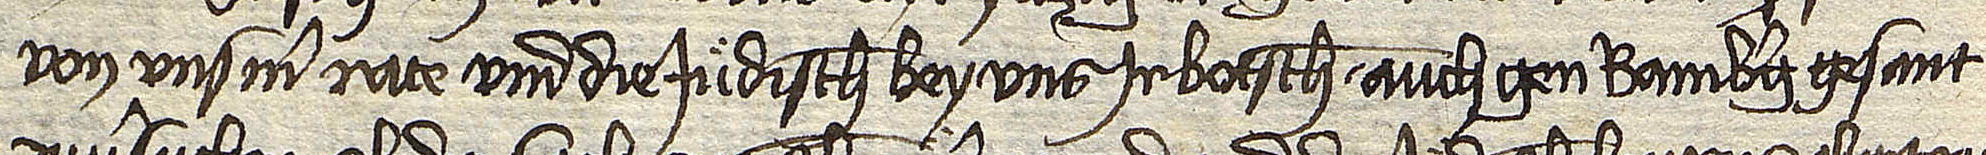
von vnſm* rate vnd die Iüdiſch* bey vns Ir botſch* / auch gen Bamb*g geſant
